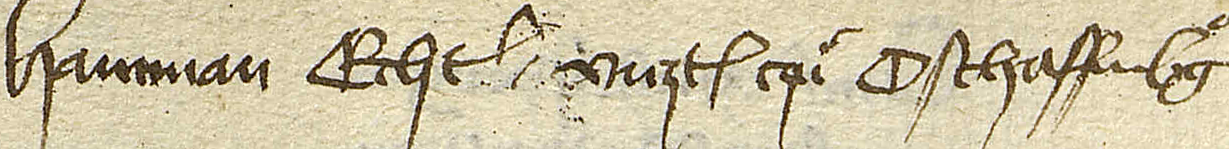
hanman Echt* / vicʒt* cʒu Oſchaffenbg*
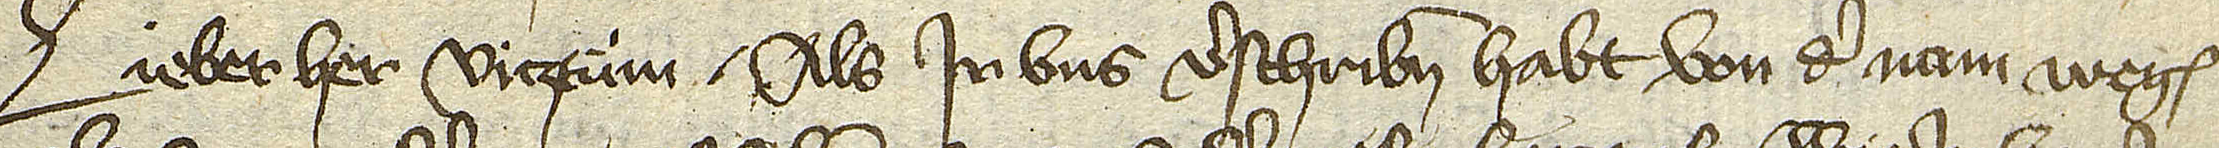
Lieber her Vicʒtüm / Als Ir vns v*ſchribn* habt / von d* nam weg*
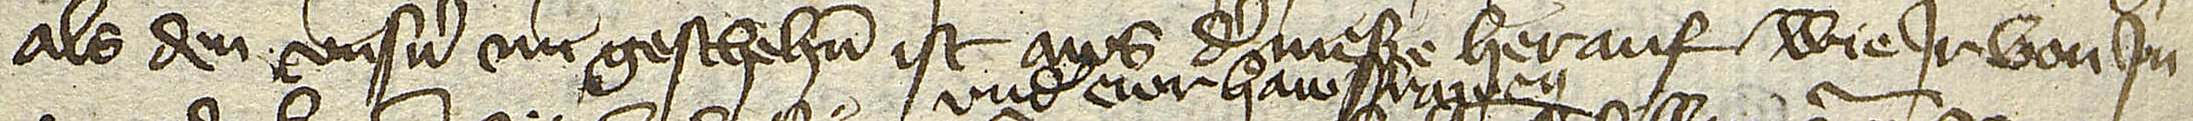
als den vnſn* nu geſchehn* iſt aws d* meſʒe herauf / wie Ir von In
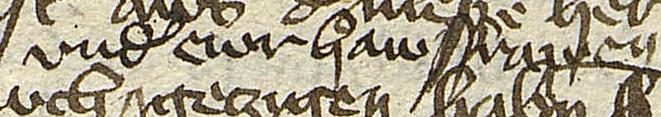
vnd* ewr hawſfrawen
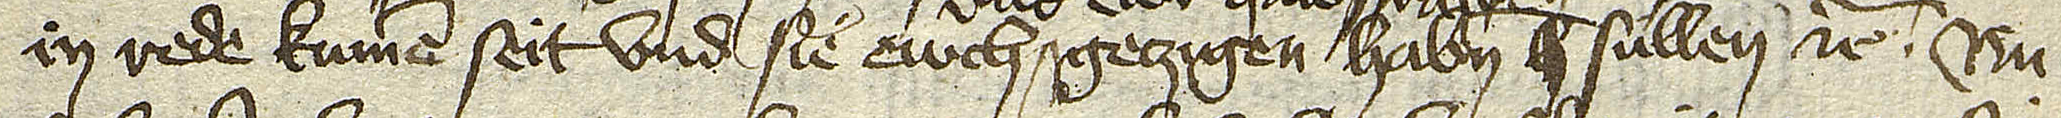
in rede kume* ſeit vnd ſie ewch gecʒige habn* h ſüllen ec* . Nu
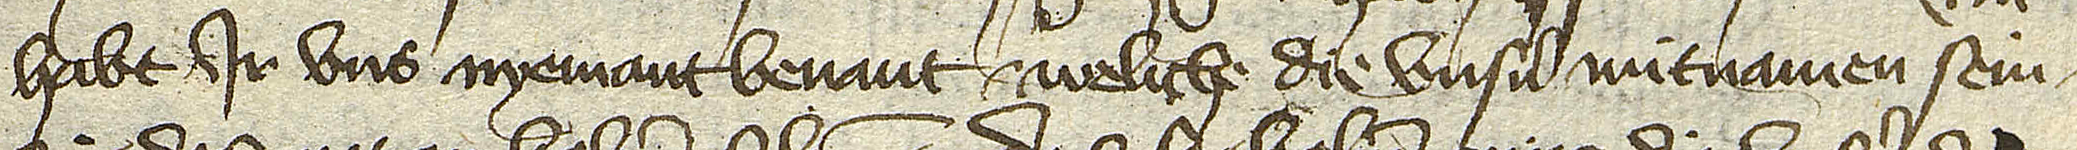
habt Ir vns nyemant benant / weliche die vnſn* mitnamen ſein
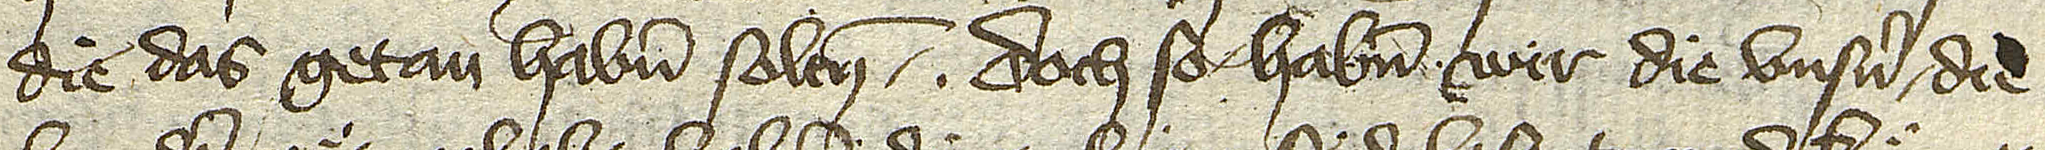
die das getan habn* ſoltn* / . Doch ſo habn* wir die vnſn* / die
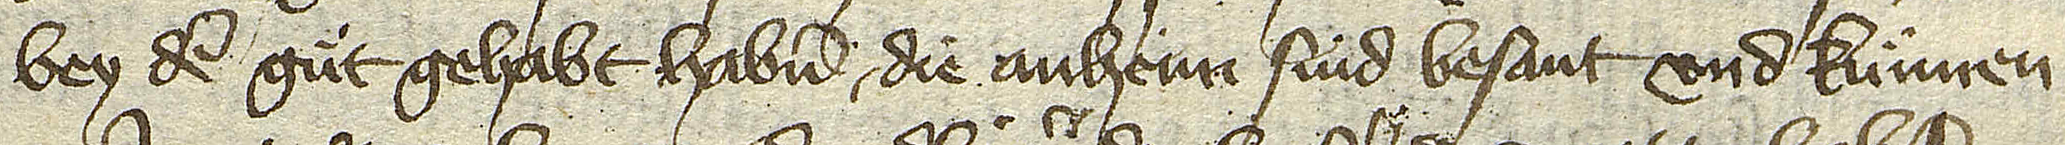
bey d* güt gehabt habn* / die anheim ſind beſant vnd künnen
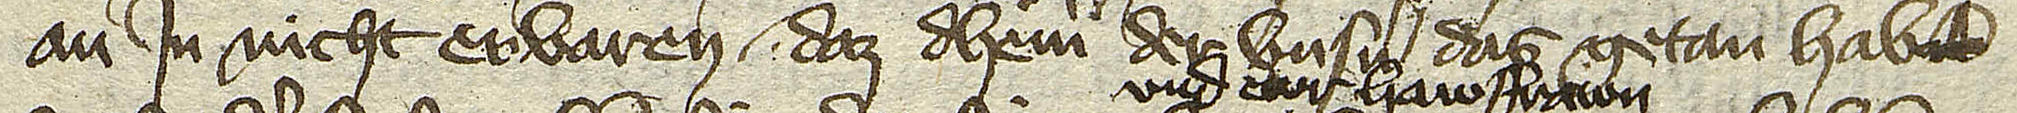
an In nicht ervaren / . daʒ dhein* der vnſn* das getan habn*
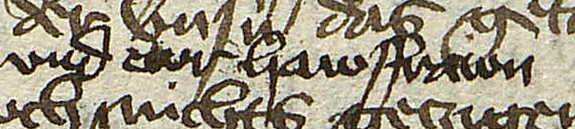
vnd ewr hawſfrawn
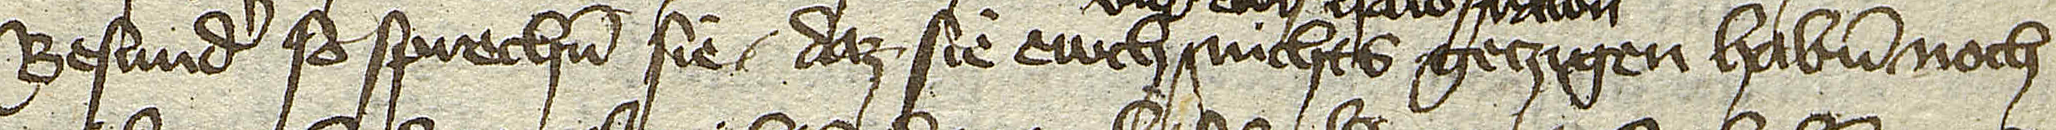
Beſund* ſo ſprechn* ſie / daʒ ſie ewch nichts gecʒigen habn* noch
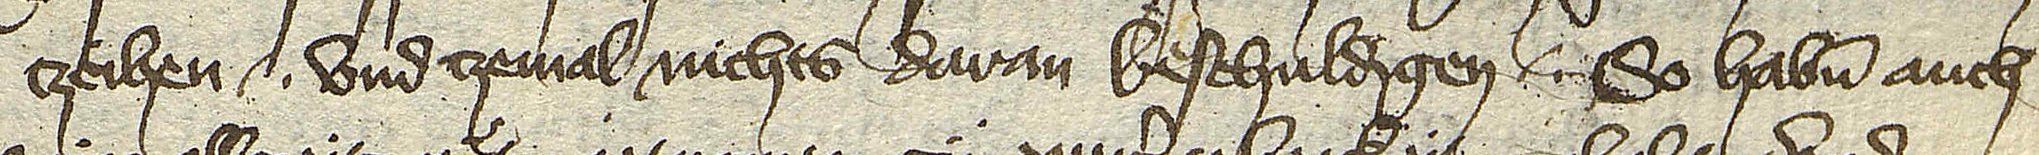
cʒeihen / . vnd cʒemal nichts daran beſchuldigen / . So habn* auch
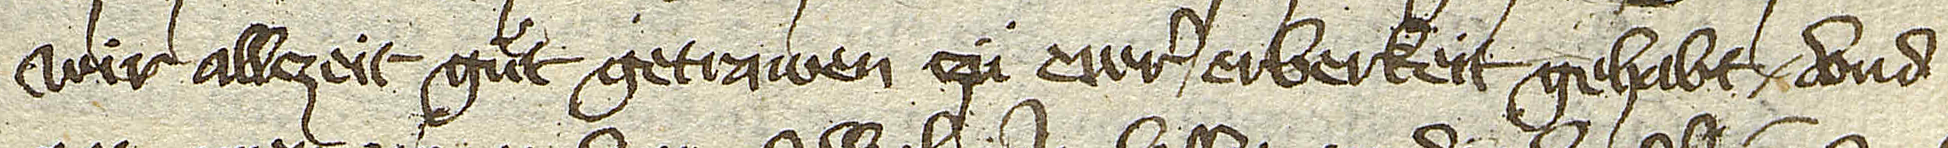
wir allcʒeit güt getrawen cʒü ewr* erberkeit gehabt / vnd
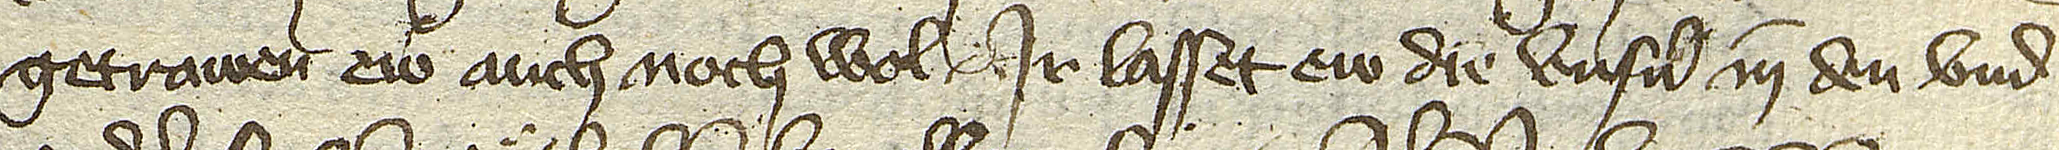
getrawen ew auch noch wol / Ir laſſet ew die vnſn* in den vnd
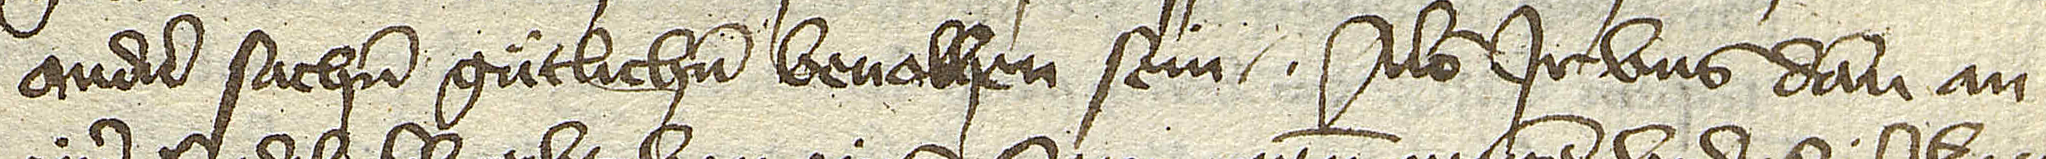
andn* ſachn* gütlichn* beuolhen ſein / . Als Ir vns dan* an
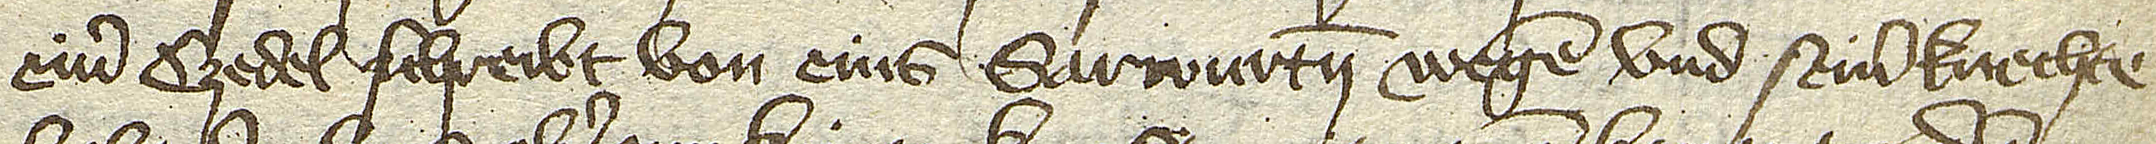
ein* Cʒedel ſchreibt von eins Sarwurtn* wege* vnd ſein* knechte
